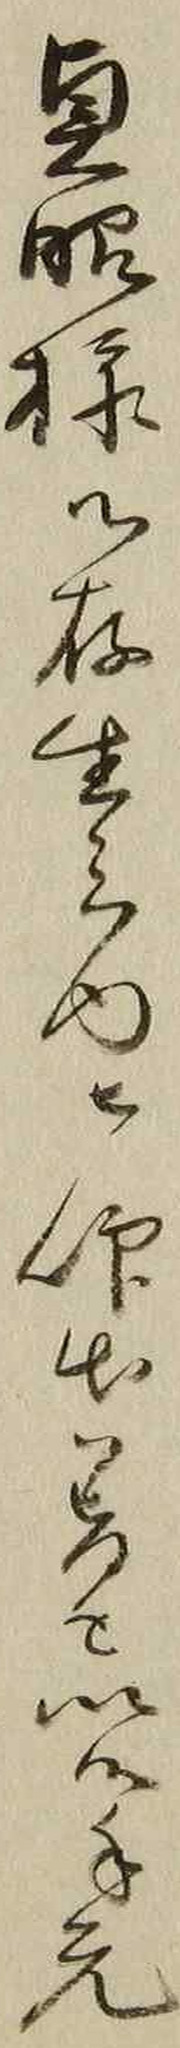貞昭様御存生之内被仰出候旨を以御手元
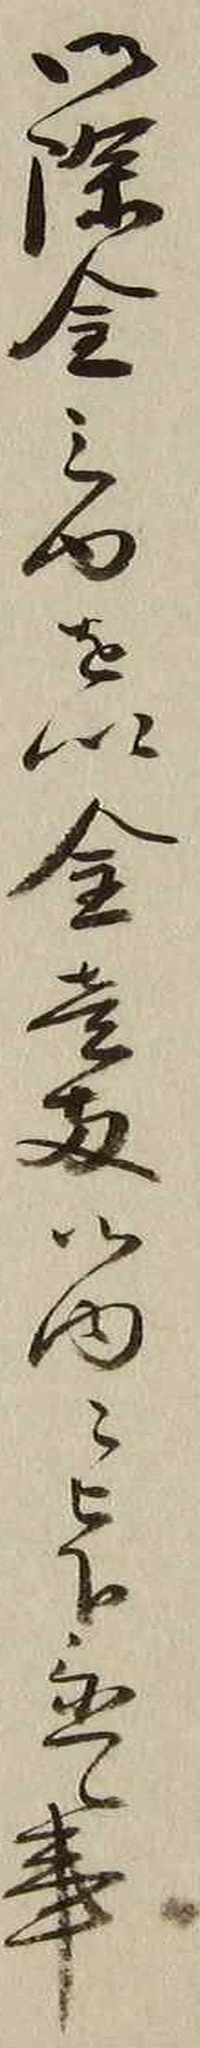御除金之内を以金壱両御内々被下置候事
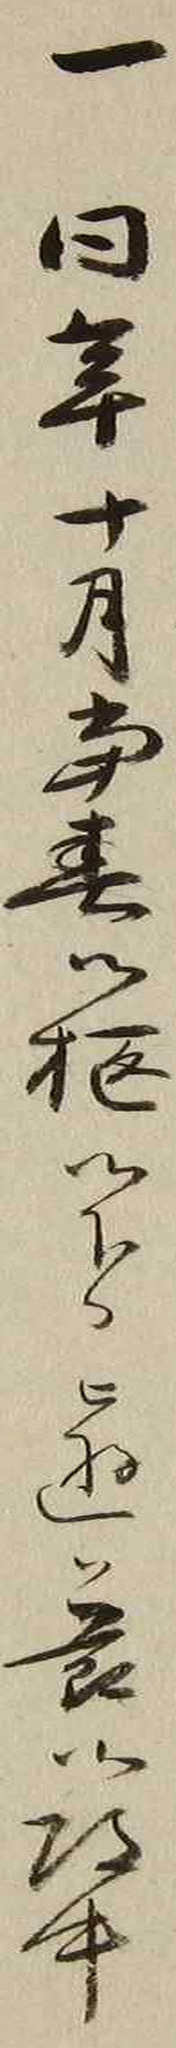一同年十月当春御枢御下り被遊候節御道中
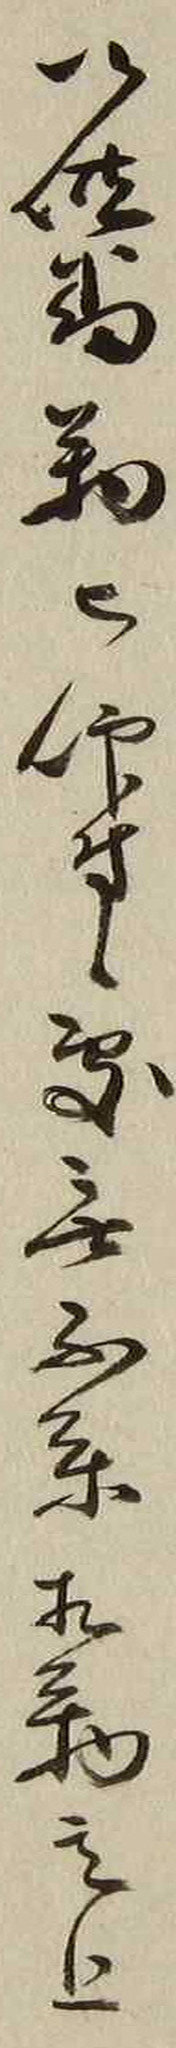御供番勤被仰付候処無不参相勤其上
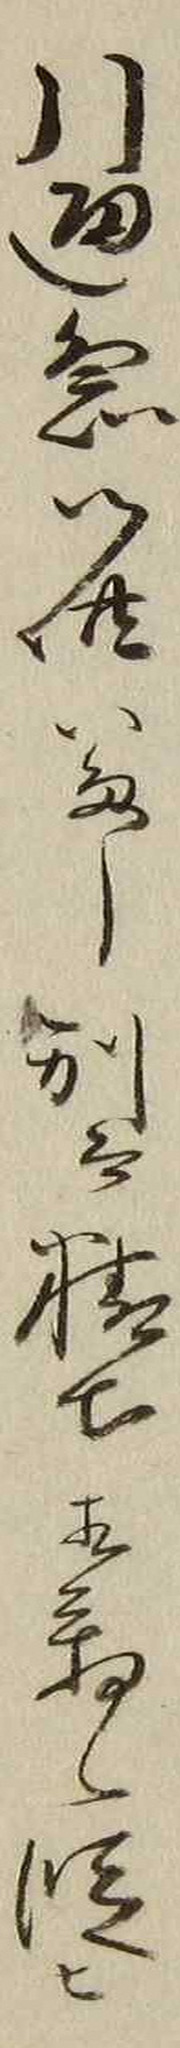引通急御供いたし別而精出相勤候段被
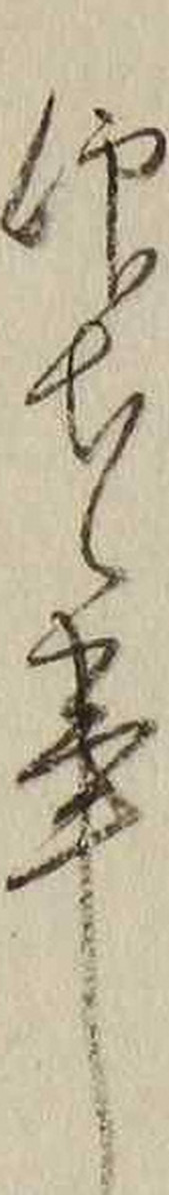仰出候事
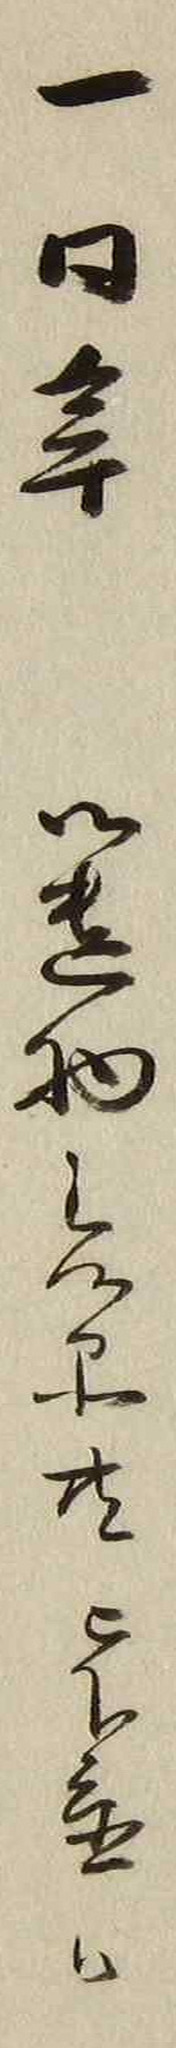一同年御遣物之御品共被下置候
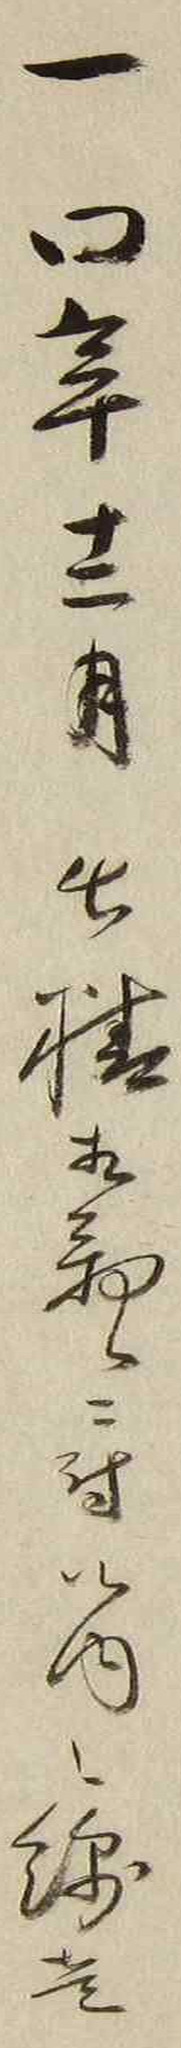一同年十二月出精相勤候ニ付御内々綿壱
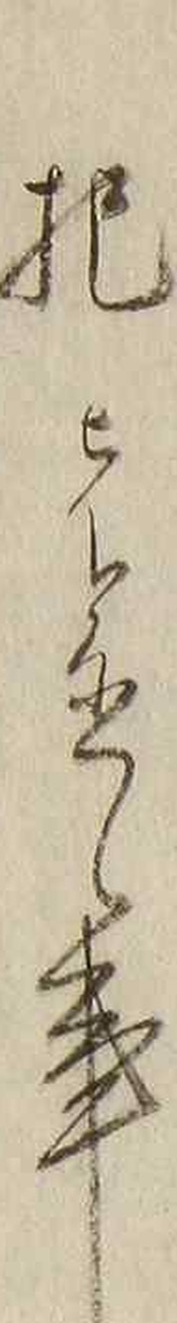把被下置候事
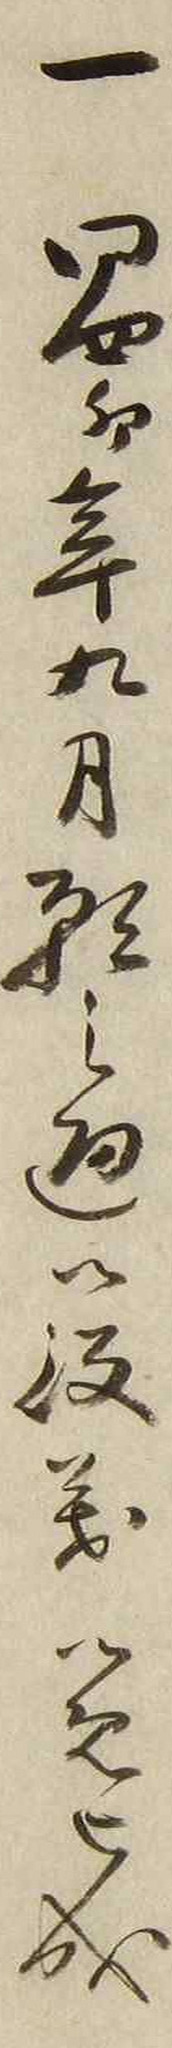一同四卯年九月願之通御役義御免被成

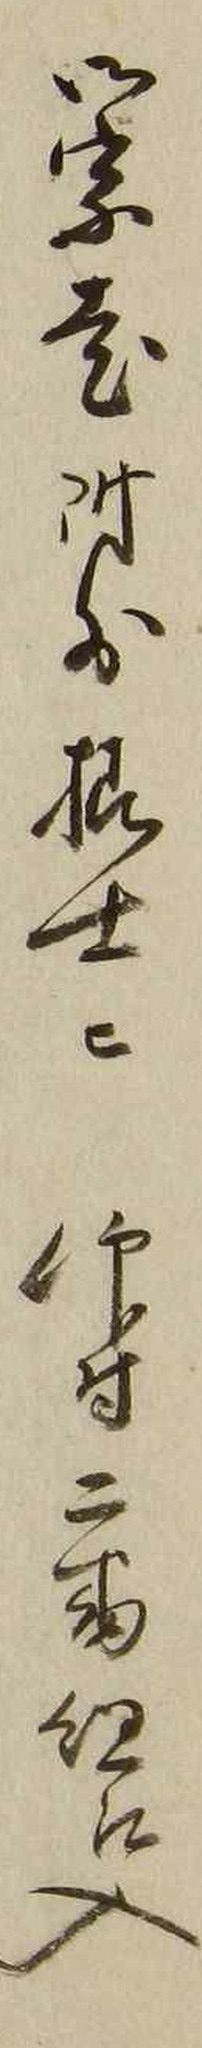御家老附外様士被仰付二番組江入
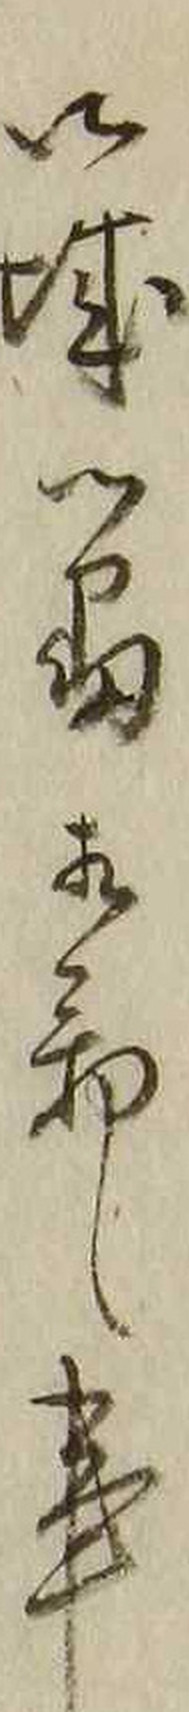御城御番相勤候事
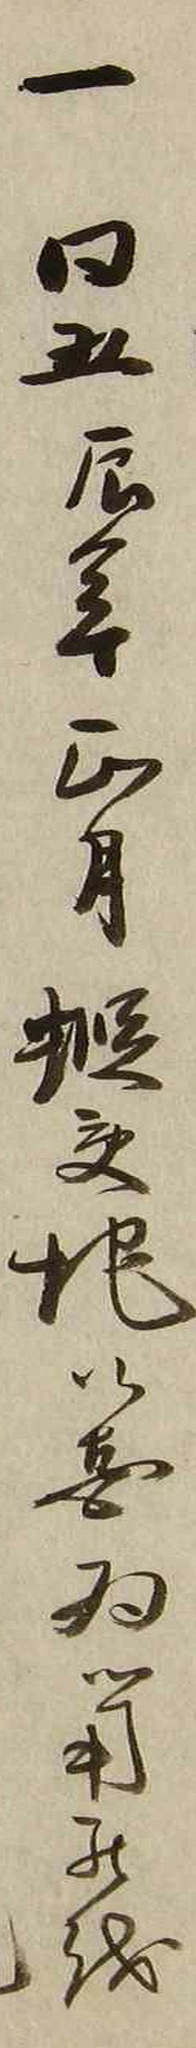一同五辰年正月蝦夷地御固為御用罷越
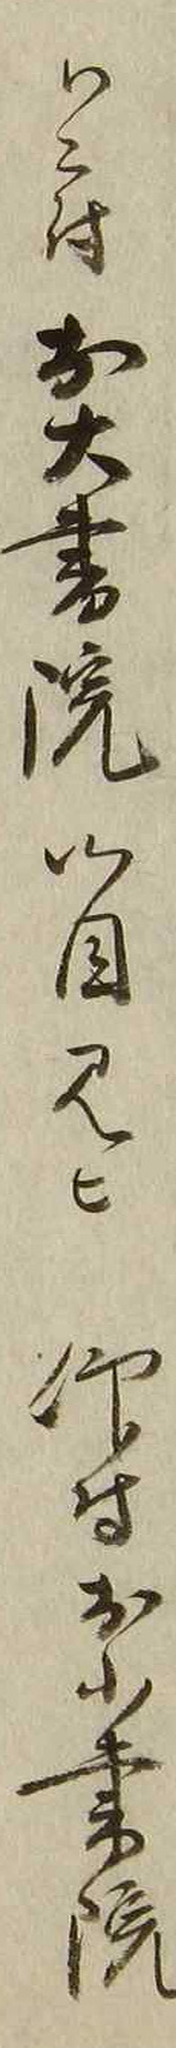候ニ付於大書院御目見被仰付於小書院
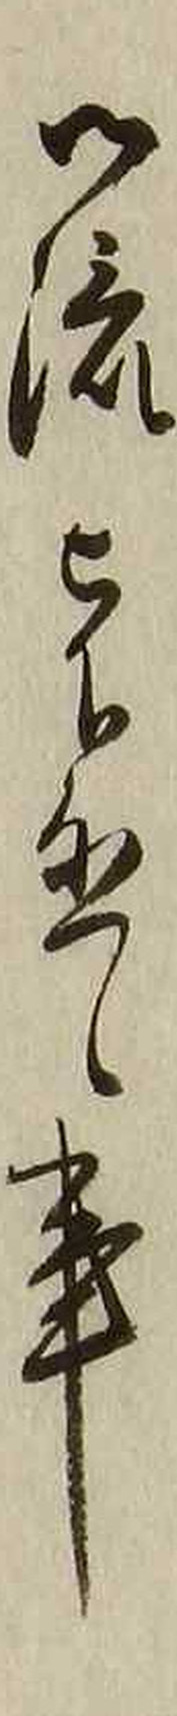御流被下置候事
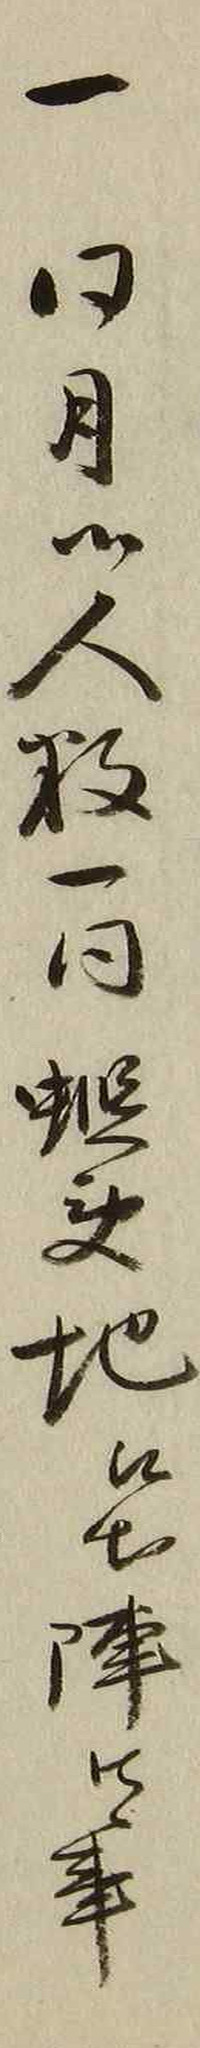一同月御人数一同蝦夷地江出陣仕候事
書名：諸士系譜　巻之311　し之部1
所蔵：会津若松市立会津図書館
